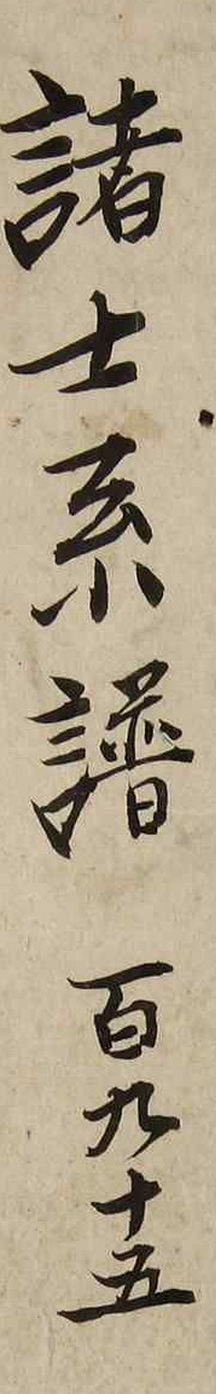諸士系譜百九十五
